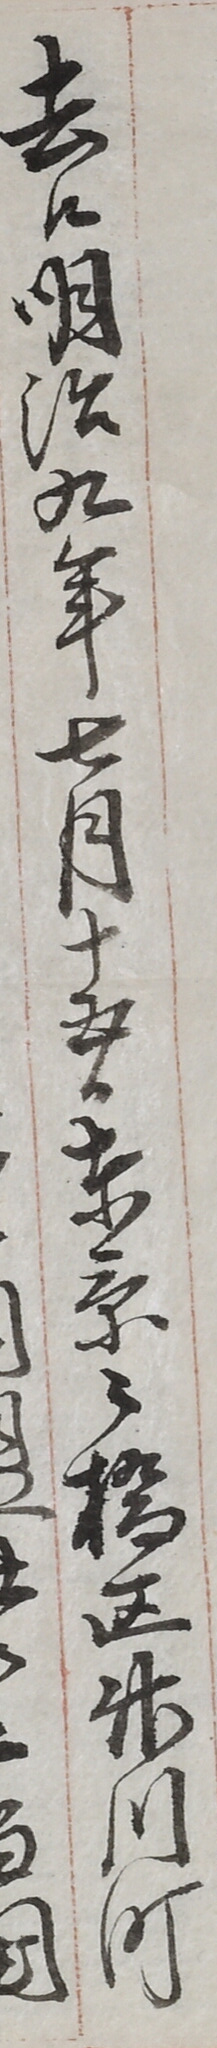去ル明治九年七月十五日東京々橋区竹川町
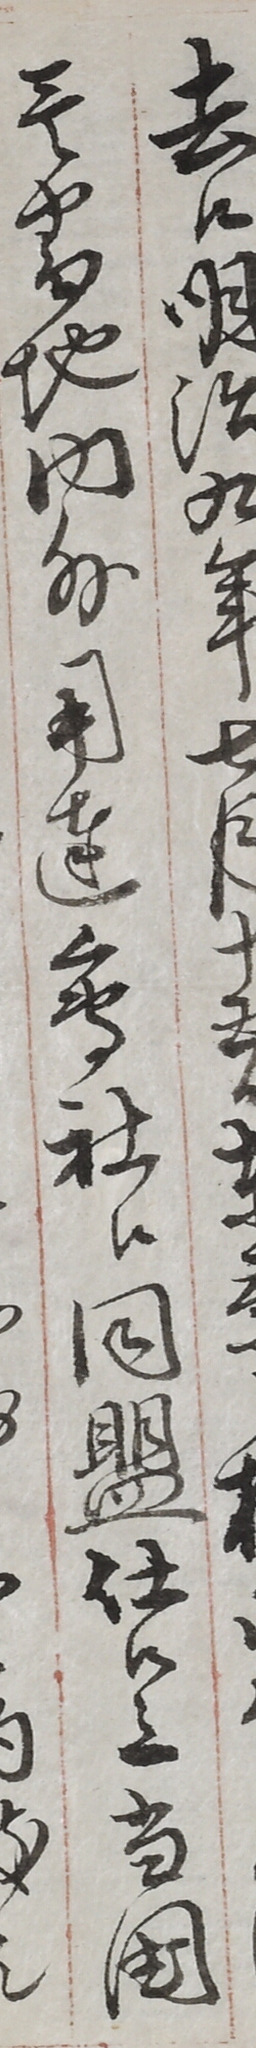壱番地内外用達会社江同盟仕候上当国
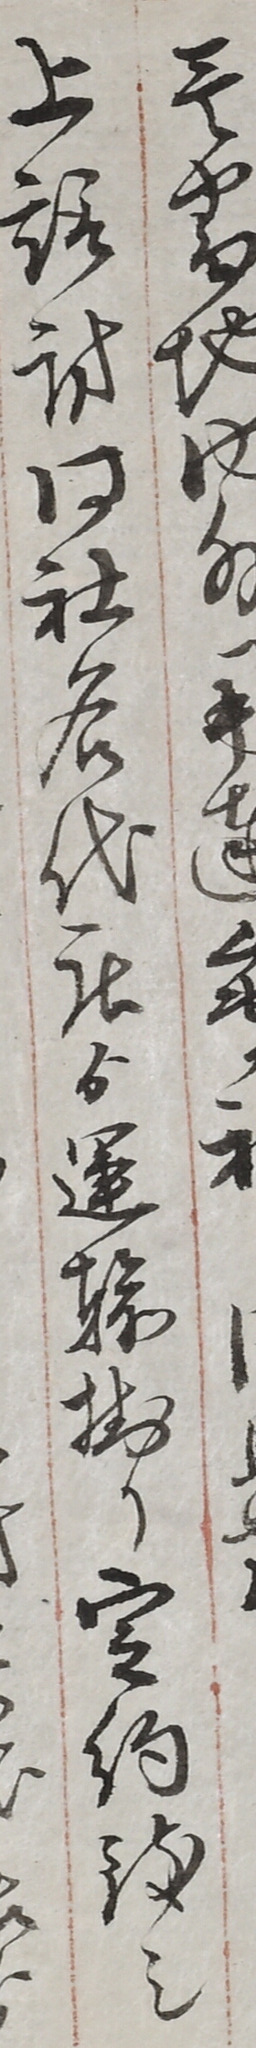上諏訪同社名代店より運輸掛り定約致シ
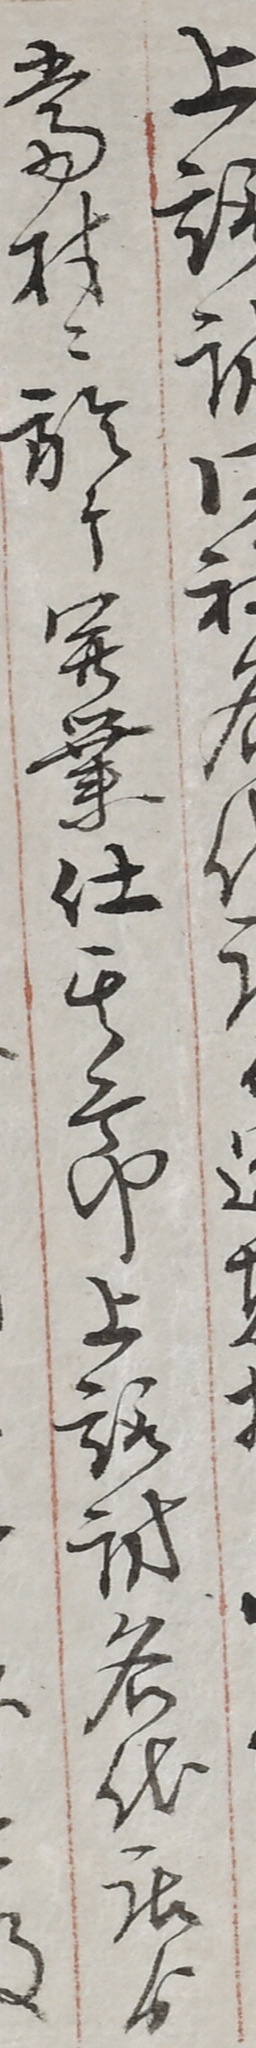当村ニ於テ開業仕其節上諏訪名代店より
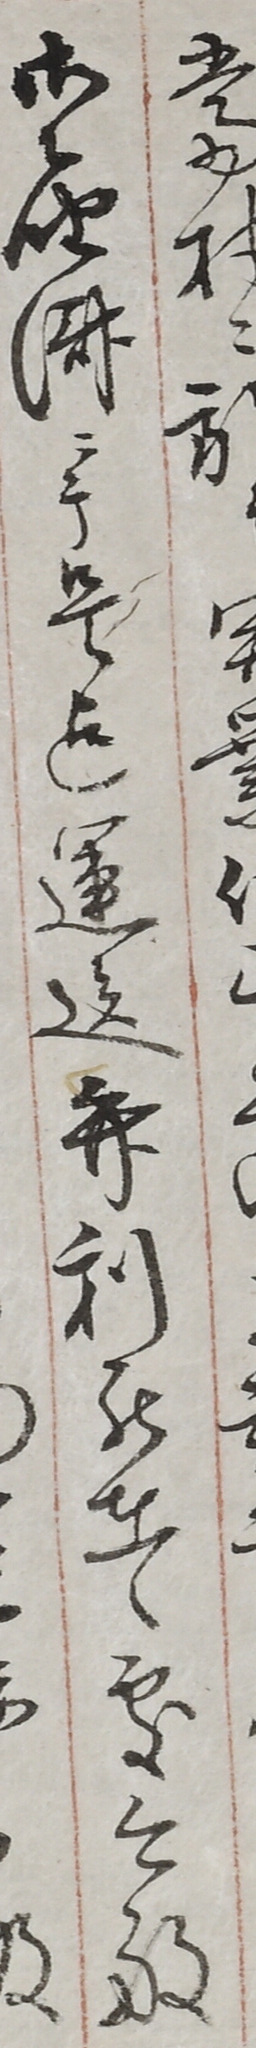御届済ニテ是迄運送弁利罷在候処今般
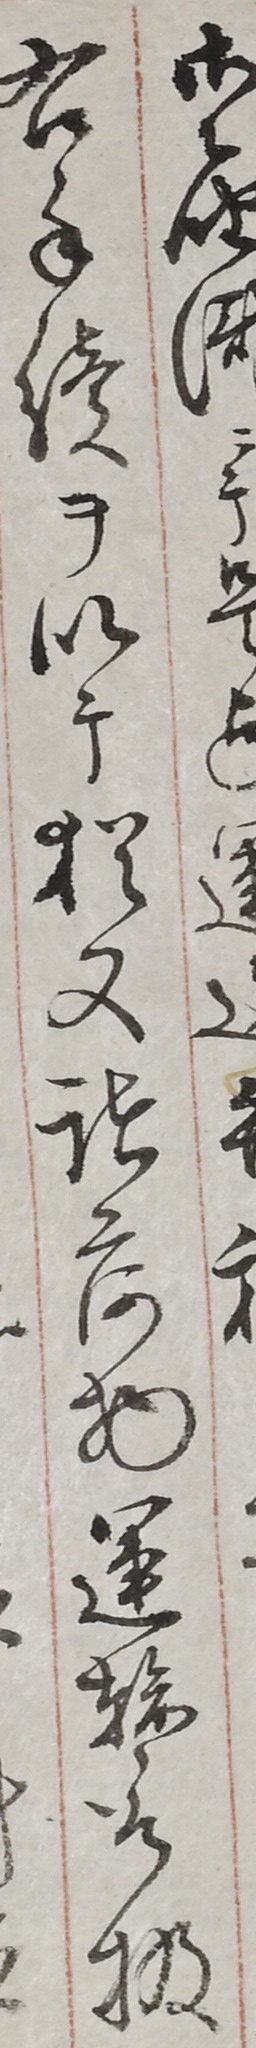右手続ヲ以テ猶又諸荷物運輸取扱
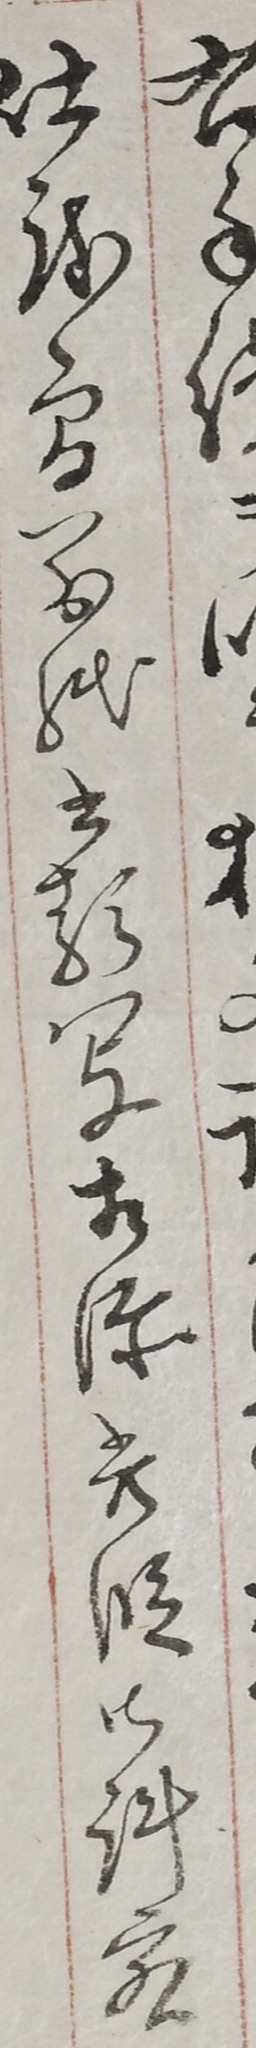仕度候間別紙書類写相添此段御許容
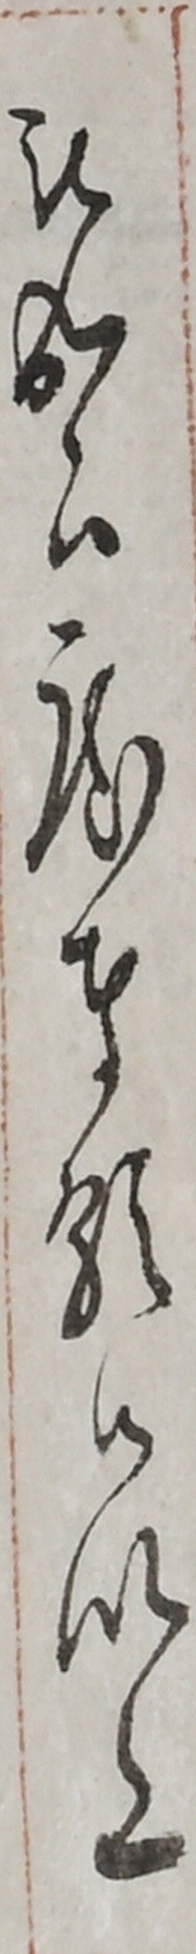被成下度奉願候以上

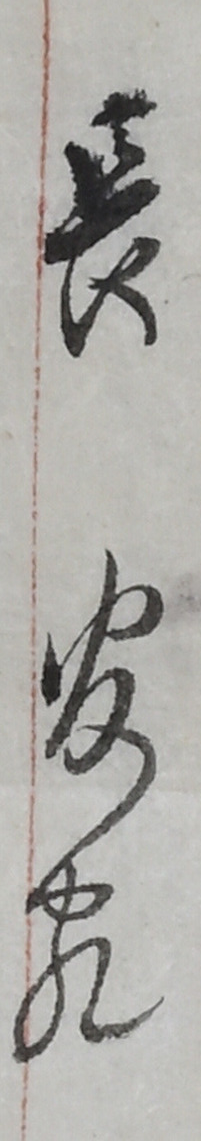長官衆
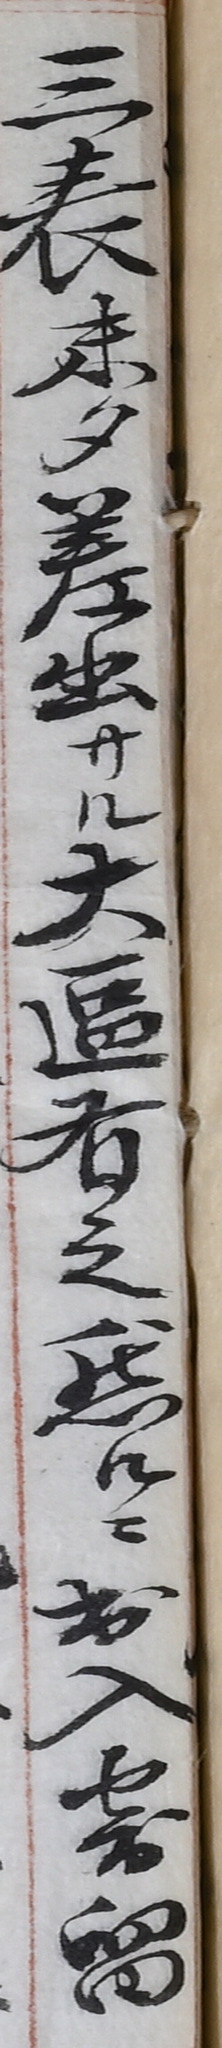三表未タ差出サル大区有之然ルニ出入寄留
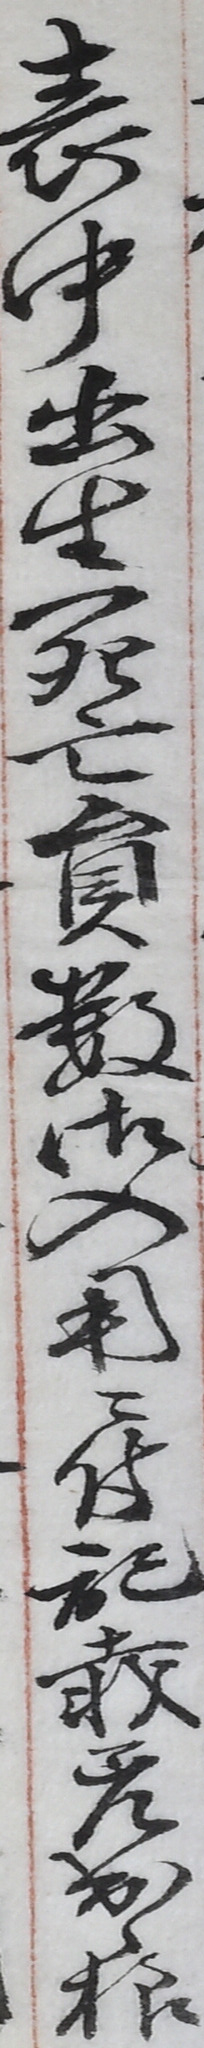表中出生死亡員数御入用ニ付記載差出候様
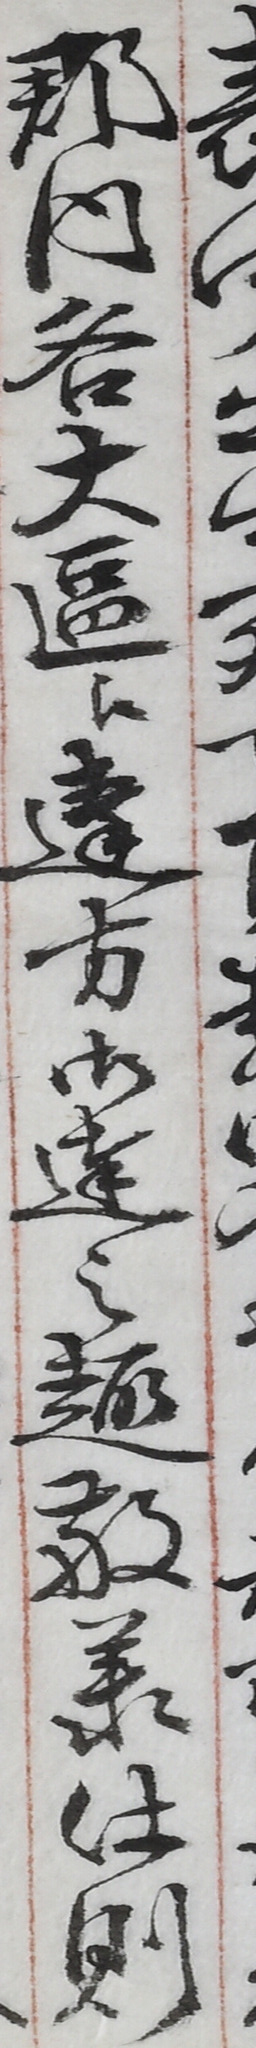郡内各大区江違方御達之趣敬承仕則
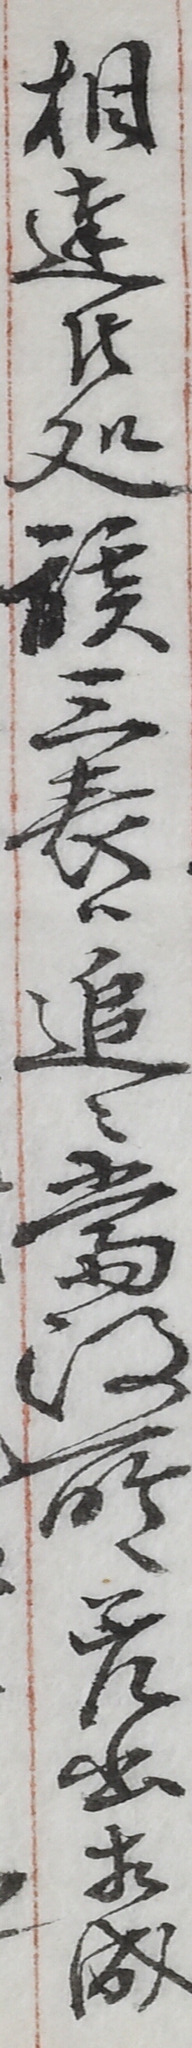相達候処族三表ハ追々當役所へ差出相成
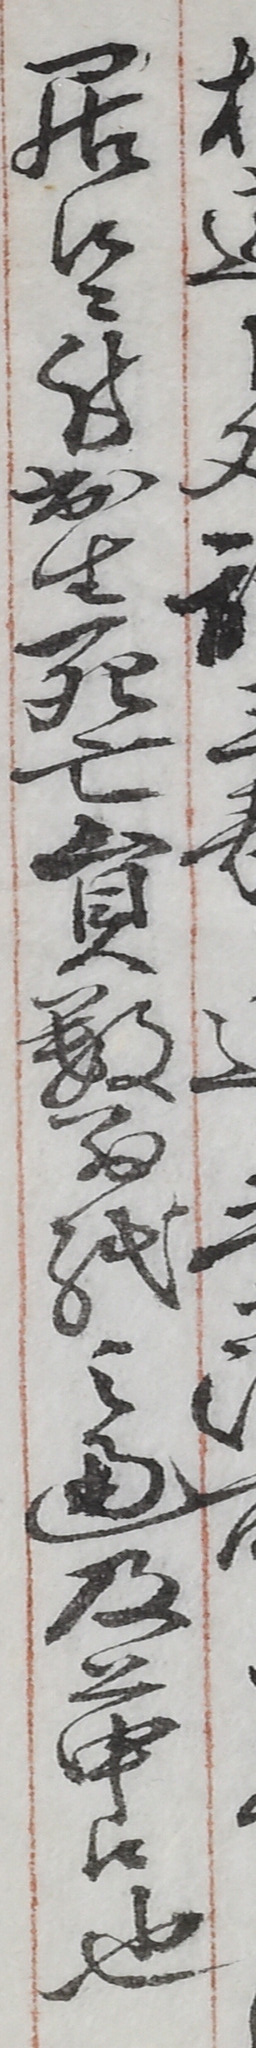居候ニ付出生死亡員数別紙之通及上申候也
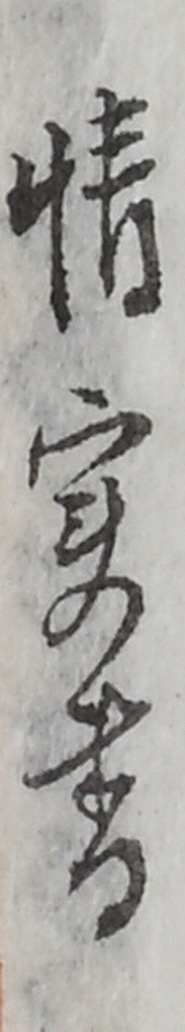情実書
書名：郡役所勤務中御用抜書
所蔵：伊那市立高遠町図書館・合同会社AMANE
